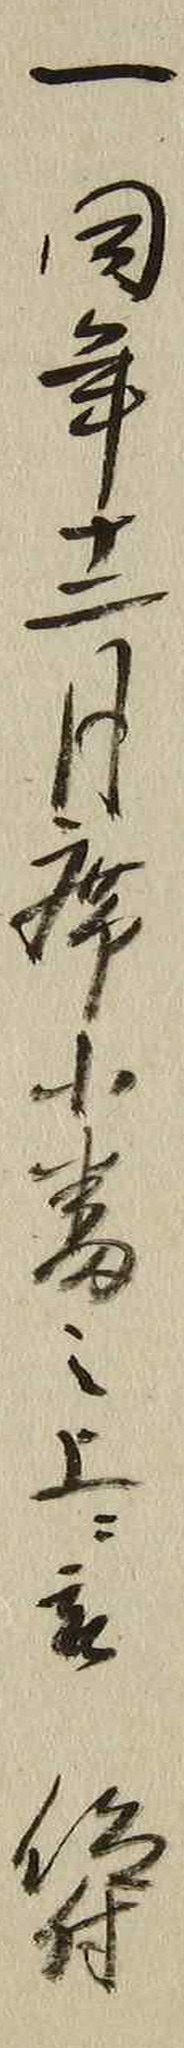一同年十二月席小番之上に被仰付
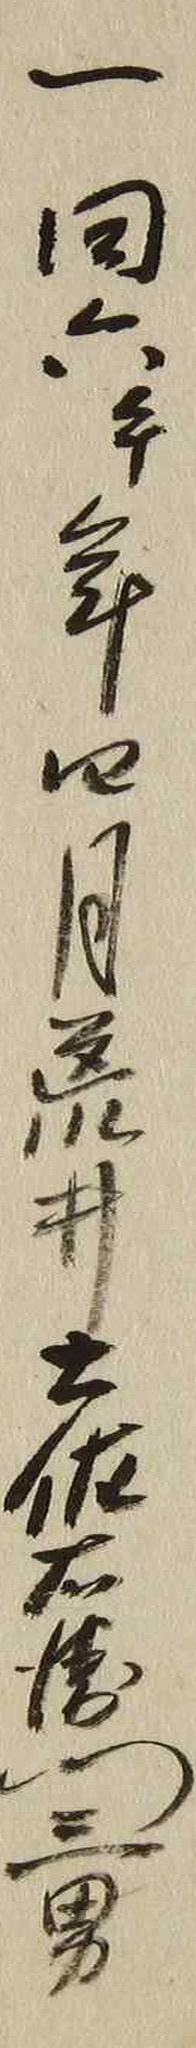一同六午年四月荒井土佐右衛門三男
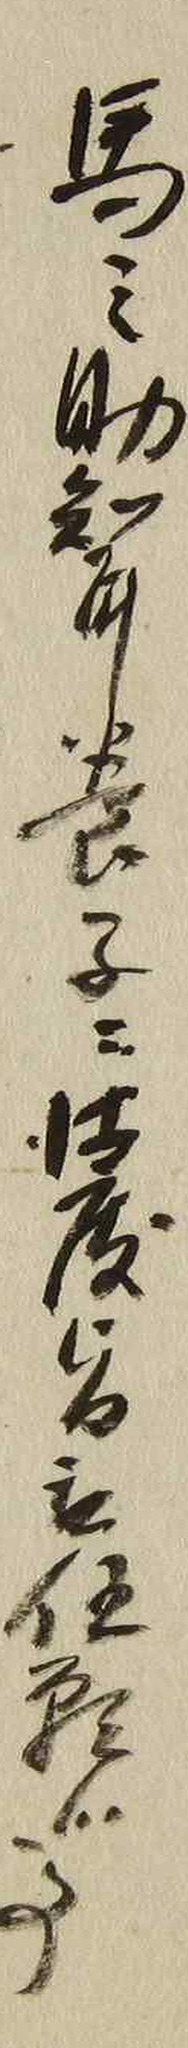馬之助聟養子に仕度旨被任願候事
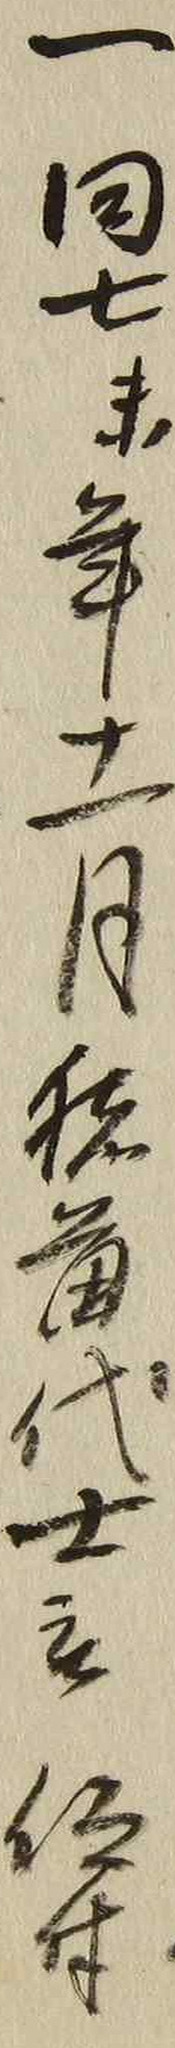一同七未年十一月猪苗代士被仰付
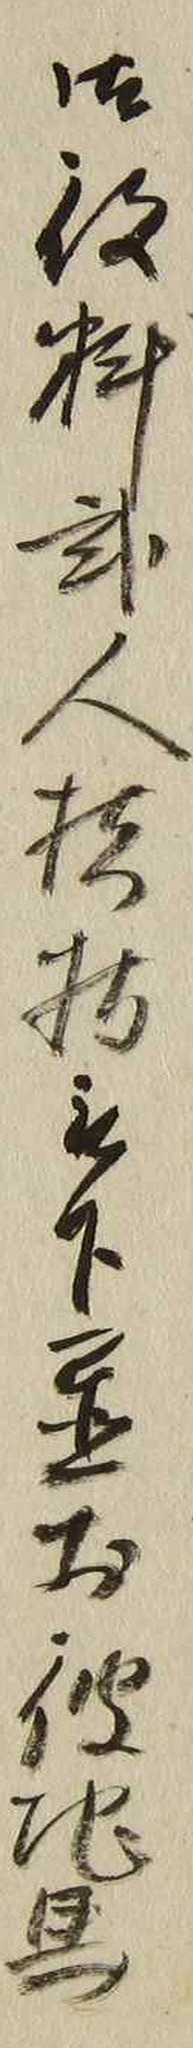御役料弐人扶持被下置於彼地馬
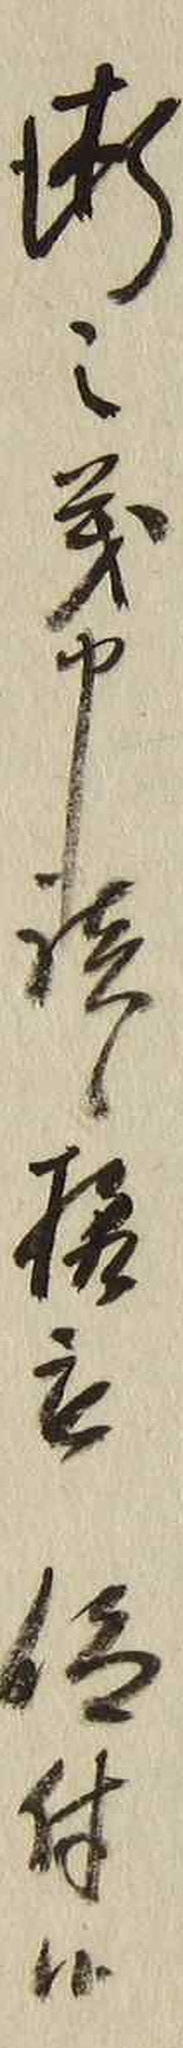術之義申談候様被仰付候
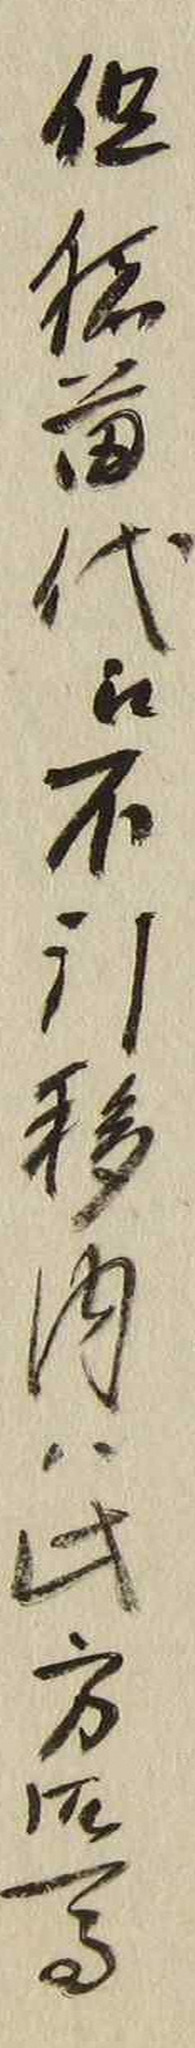但猪苗代江不引移内は此方御馬
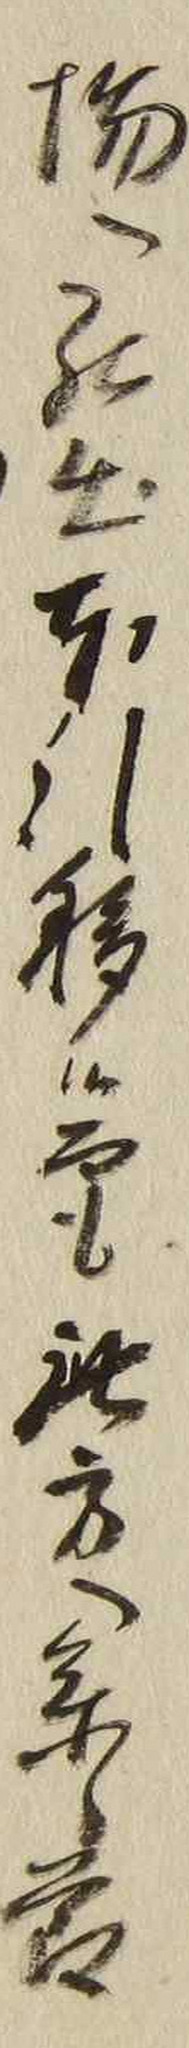場へ罷出本引移候而も此方へ参候節
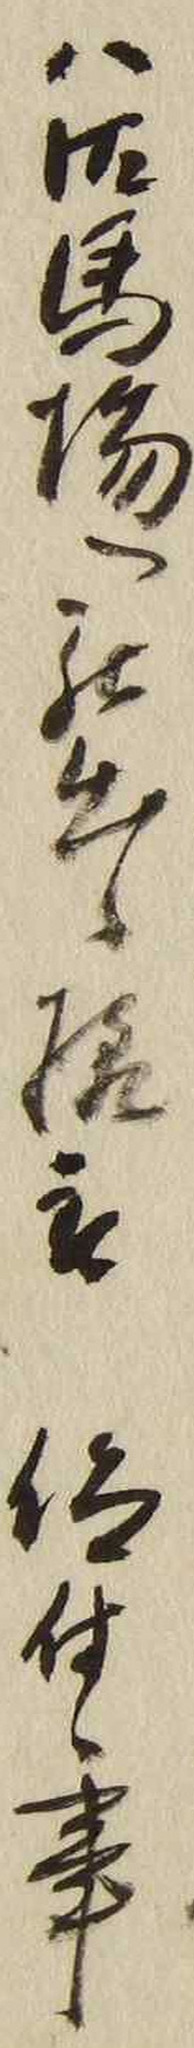は御馬場へ罷出候様被仰付候事

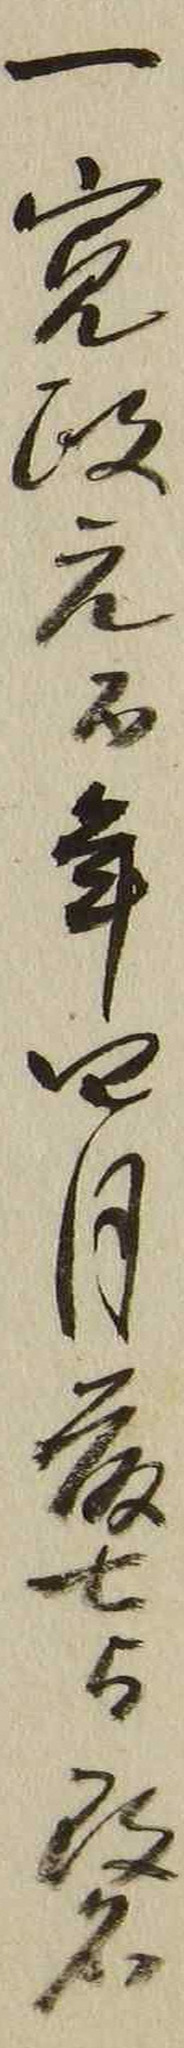一寛政元酉年四月藤七と改名
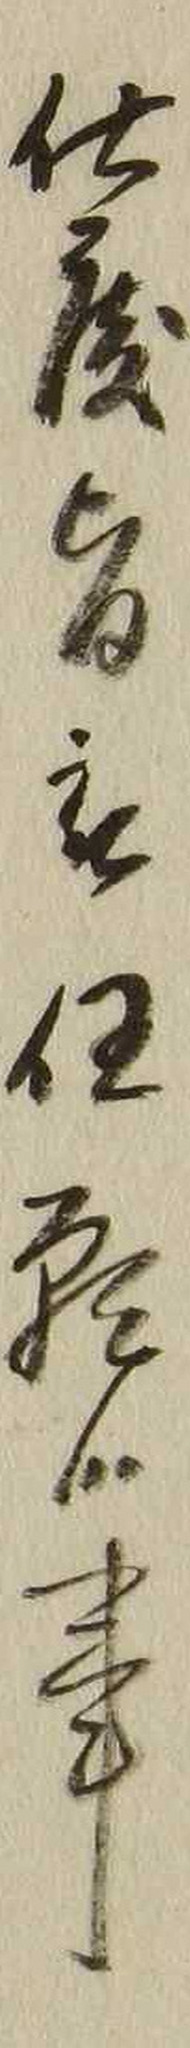仕度旨被任願候事
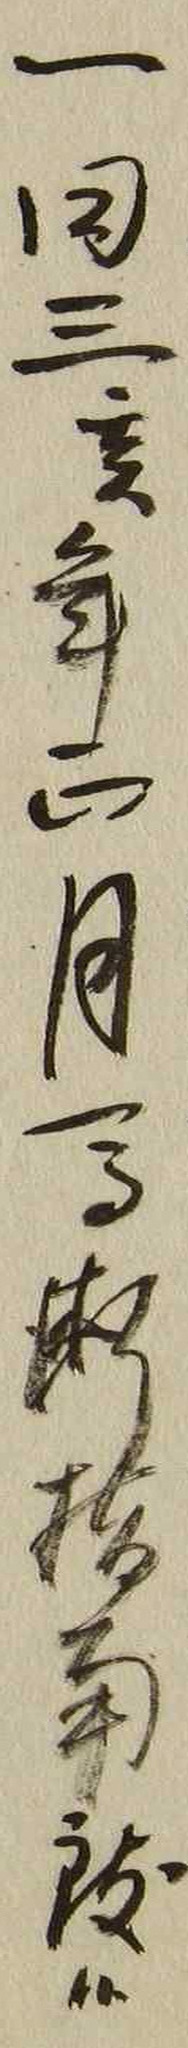一同三亥年正月馬術指南致候
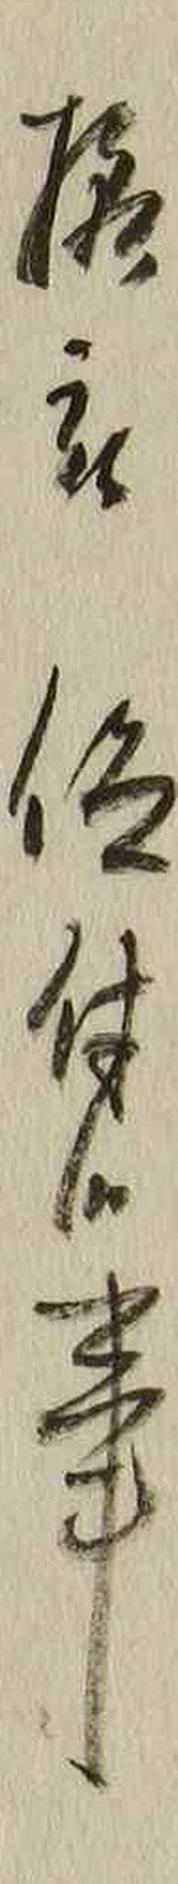様被仰付候事
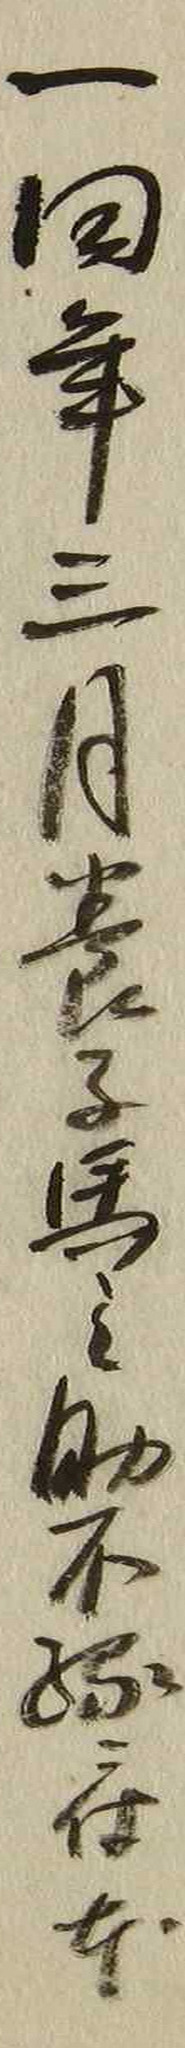一同年三月養子馬之助不埒に付本
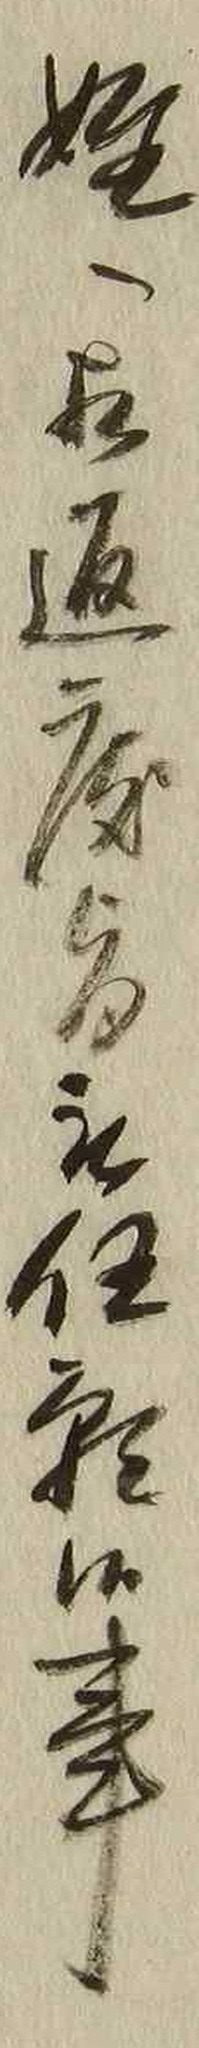姓へ相返度旨被任願候事
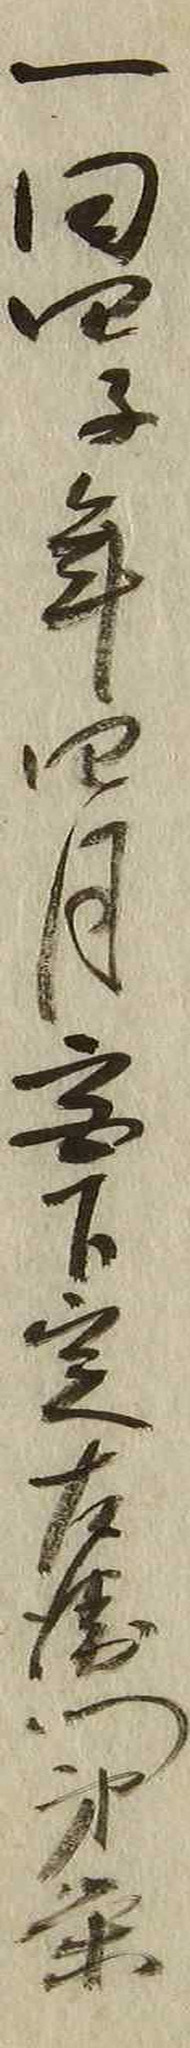一同四子年四月宮下定右衛門弟栄
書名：諸士系譜　巻之360　す之部10
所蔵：会津若松市立会津図書館
